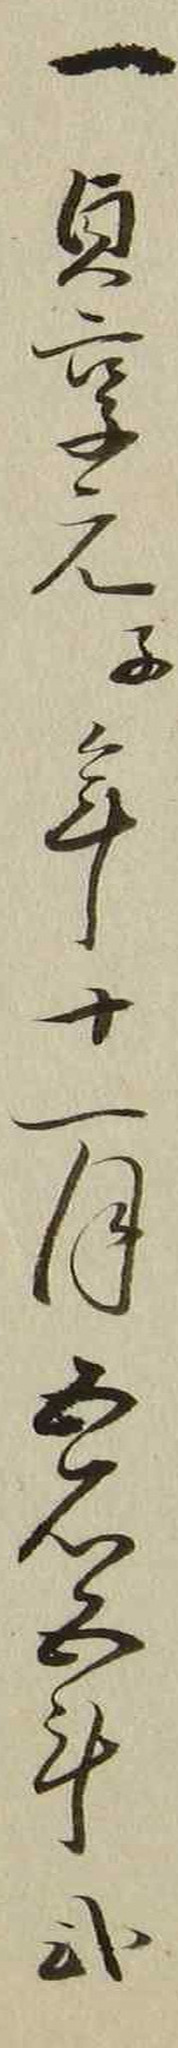一貞享元子年十一月五石五斗弐
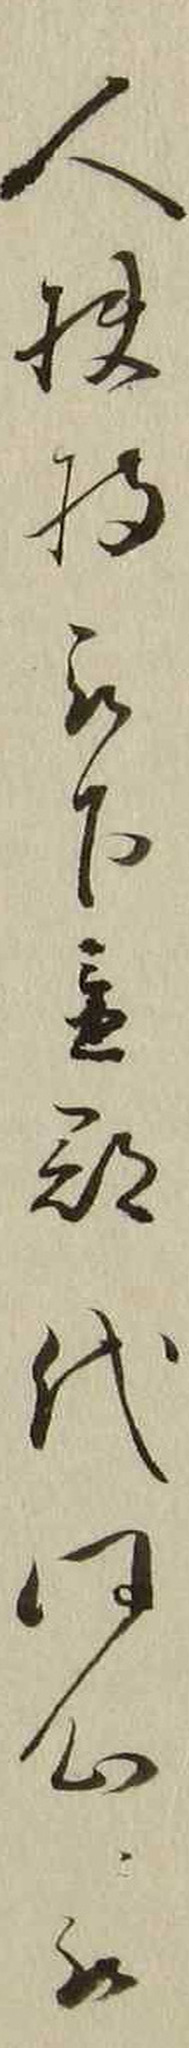人扶持被下置郡代同心被
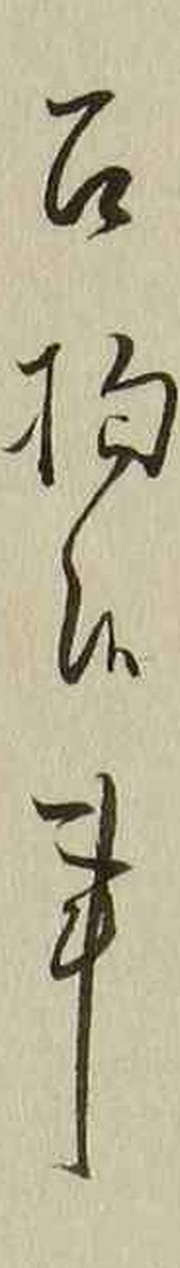召抱候事
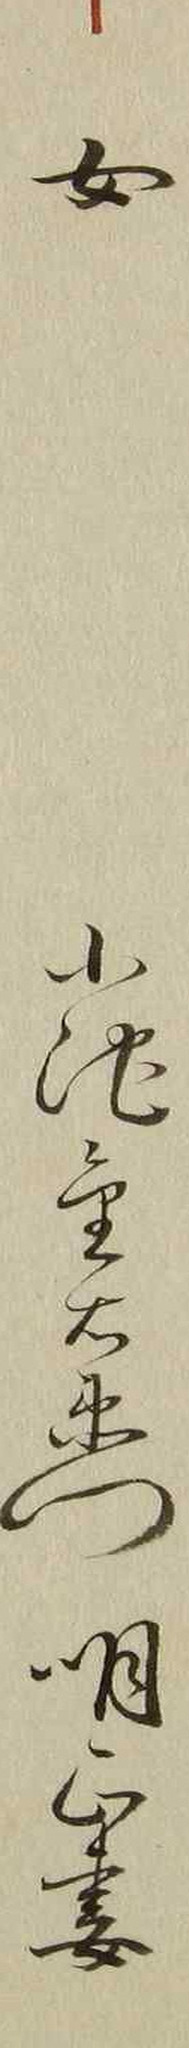女小池重右衛門明正妻
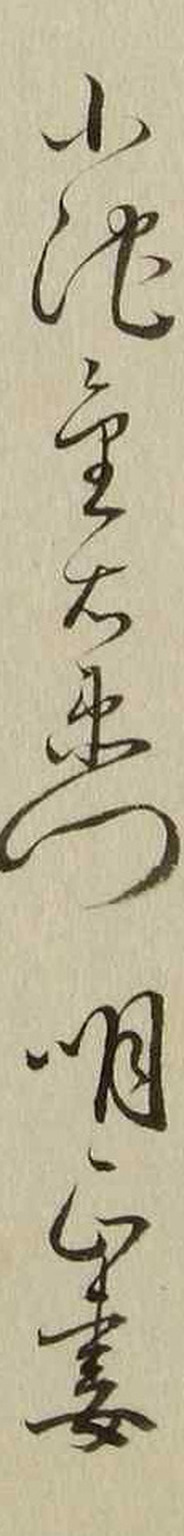女小池重右衛門明正妻
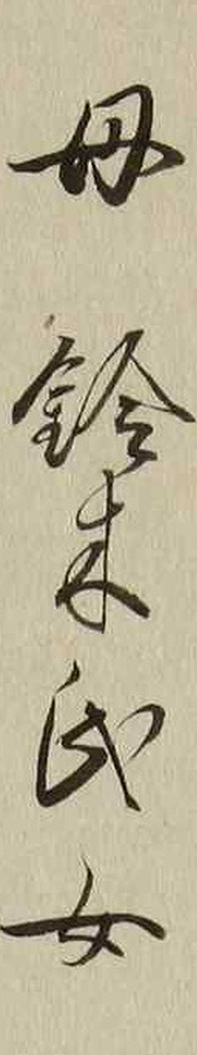母鈴木氏女
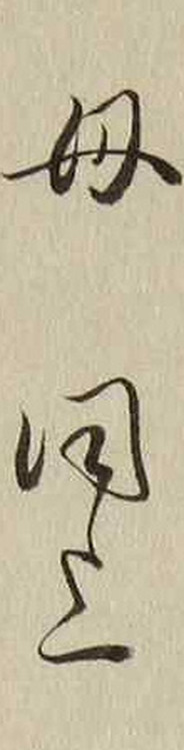母同上
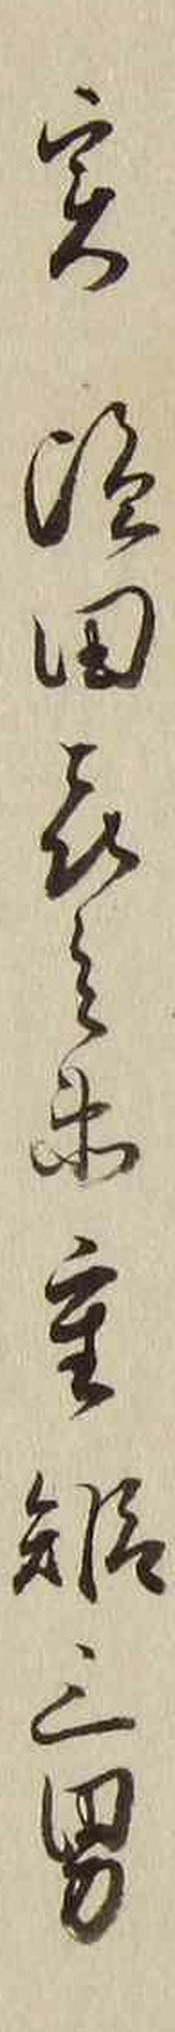実塩田喜兵衛重矩三男
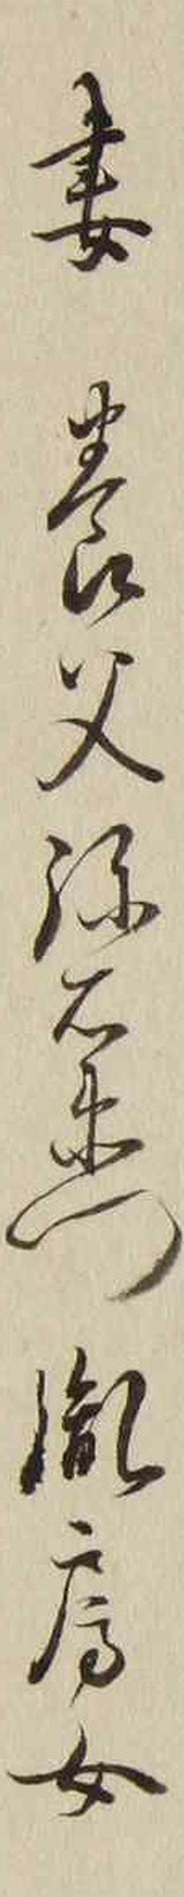妻養父弥右衛門胤房女

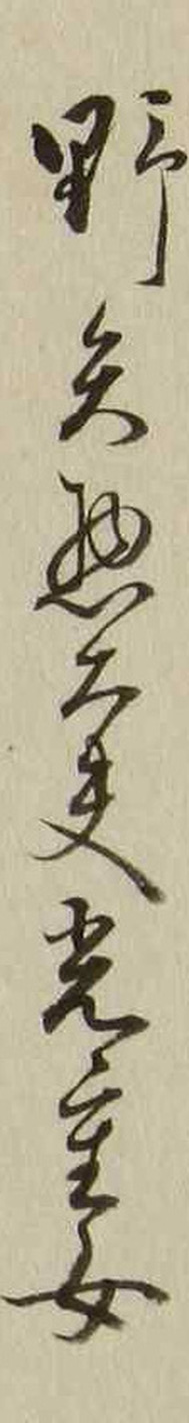野矢惣大夫光重女
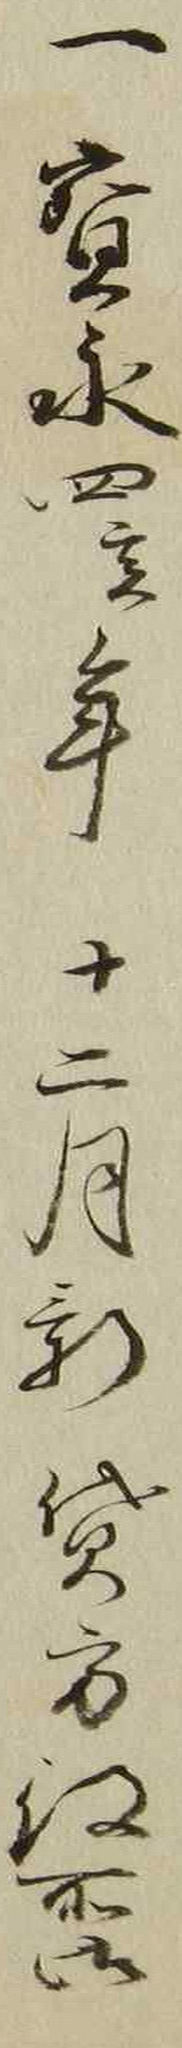一寛永四亥年十二月新貸方役所御
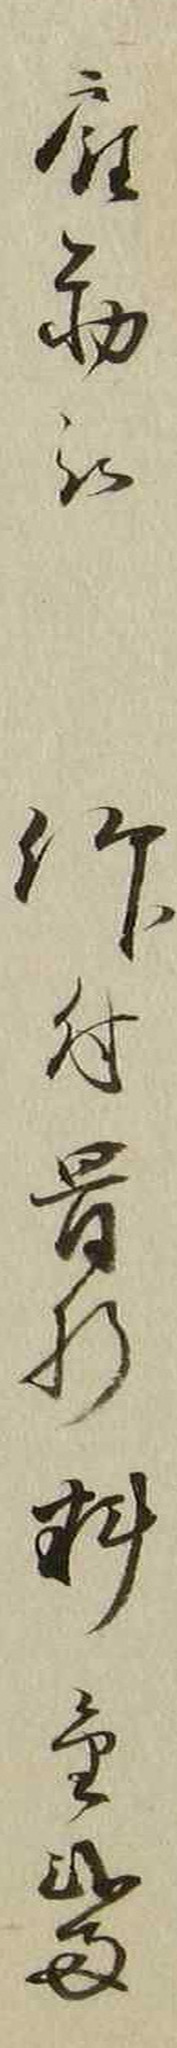雇勤被仰付骨折料金弐両
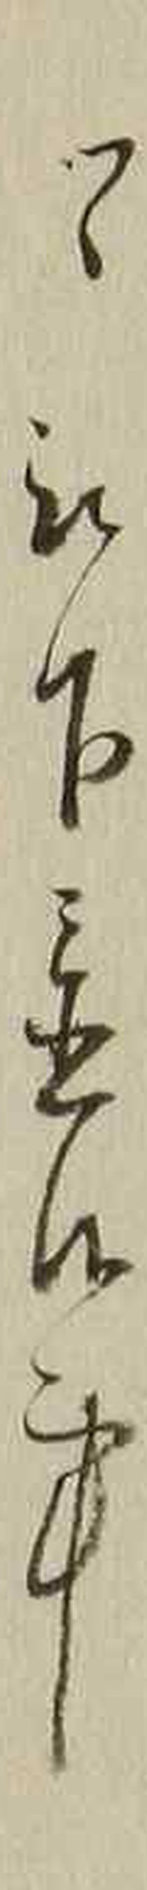ツヽ被下置候事
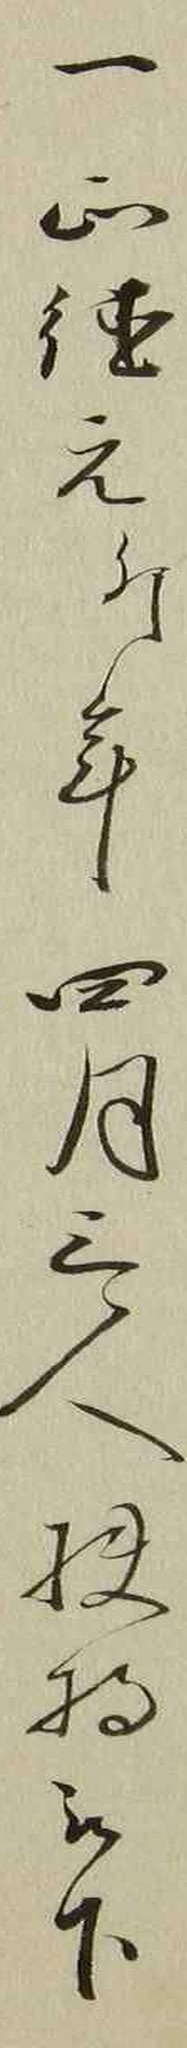一正徳元卯年四月三人扶持被下
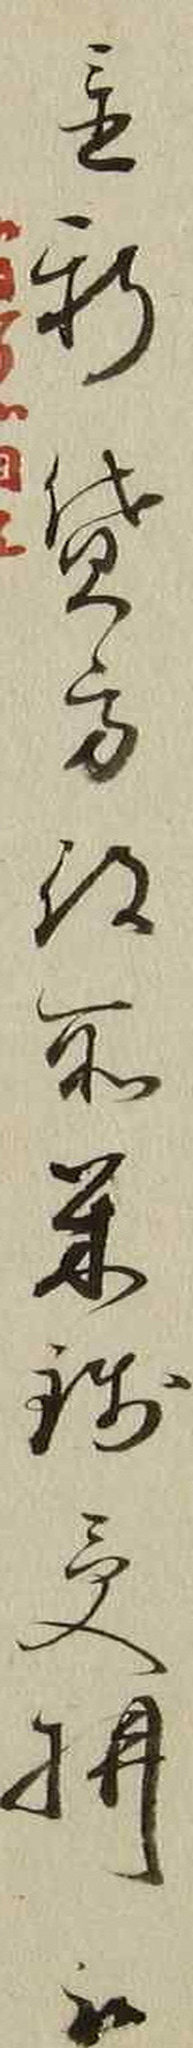置新貸方役所米銭受払被
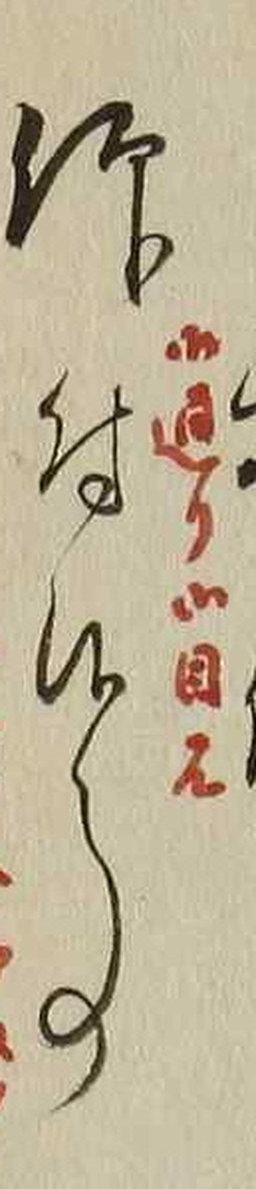仰付候事
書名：諸士系譜　巻之52　に之部3
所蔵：会津若松市立会津図書館
